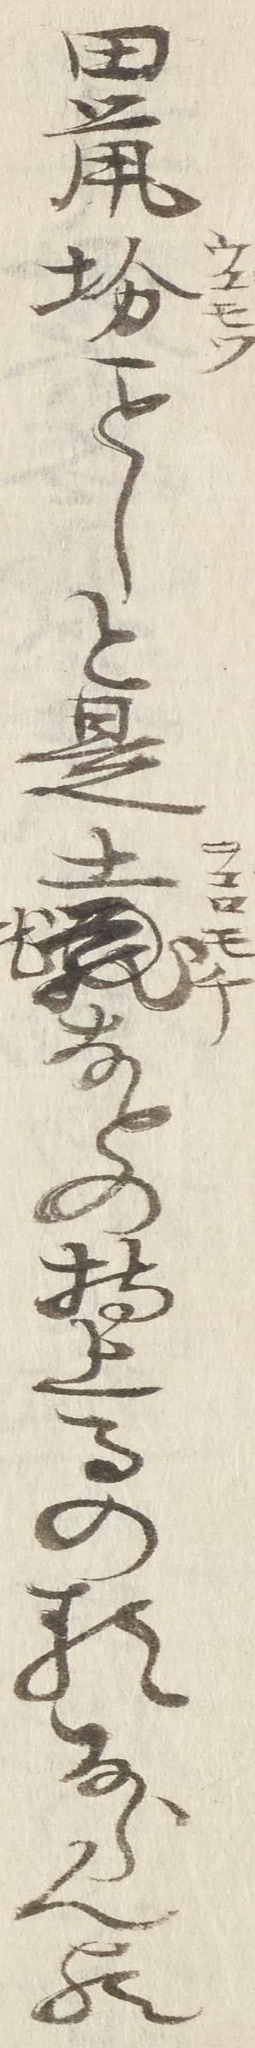田鼠墳扮ことしと是土龍などの持上るの類ならん歟
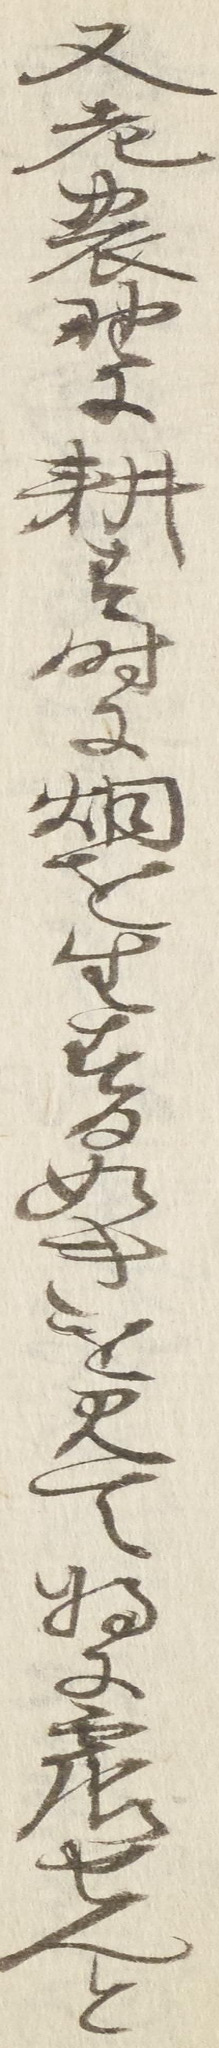又老農野に耕す時に烟を生ずる如きを見て将に震せんと
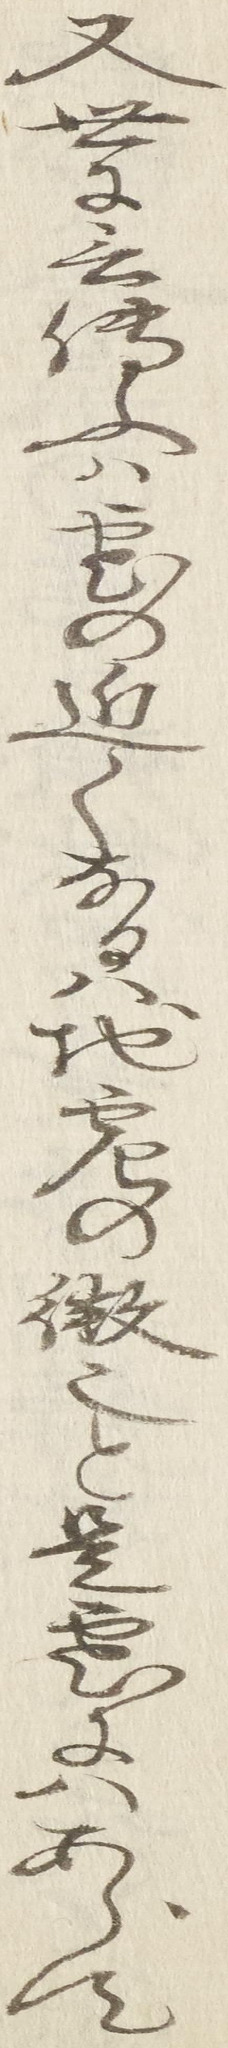又世に云伝ふは雲の近くなるは地震の徴也と是雲にはあらず
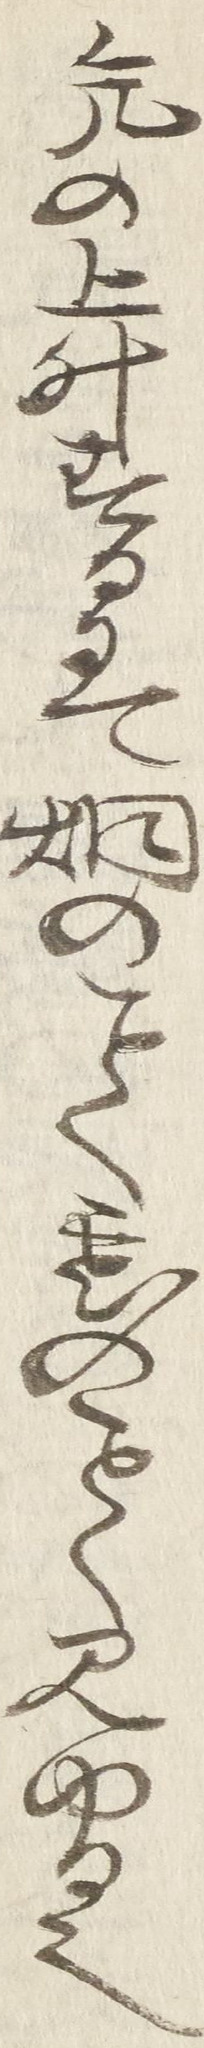気の上升するにて烟のごとく雲のごとく見ゆる也
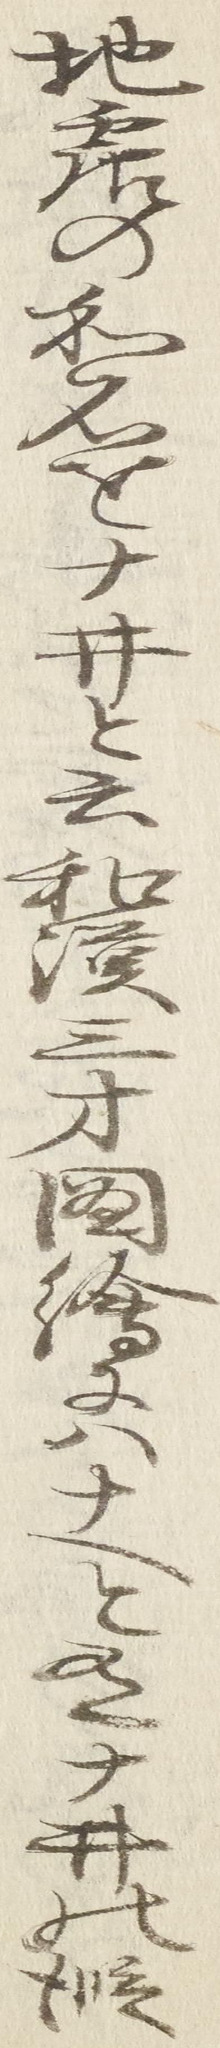地震の和名をな井と云和漢三才図絵にはなへと有な井の仮
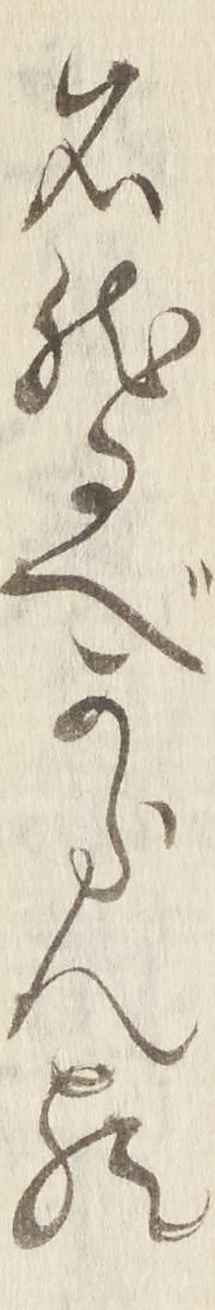名然るべからん歟
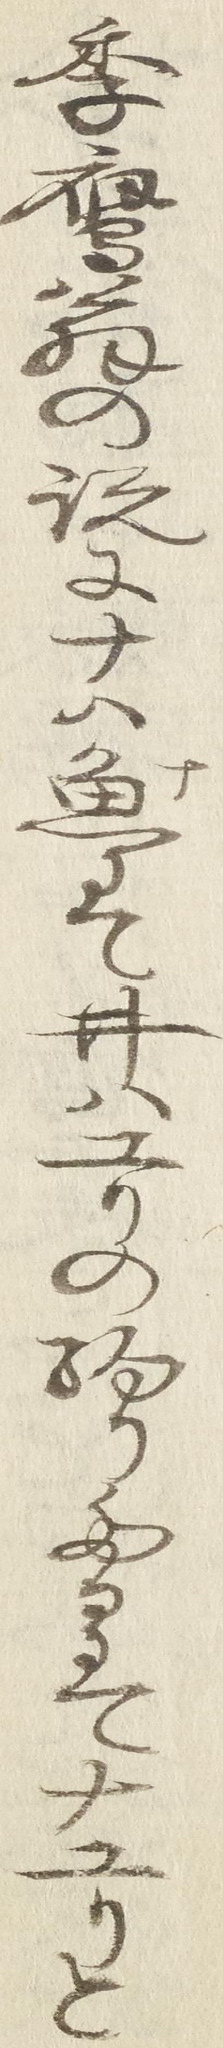季鷹翁の説になは魚にて井はゆりの約りたるにてなゆりと
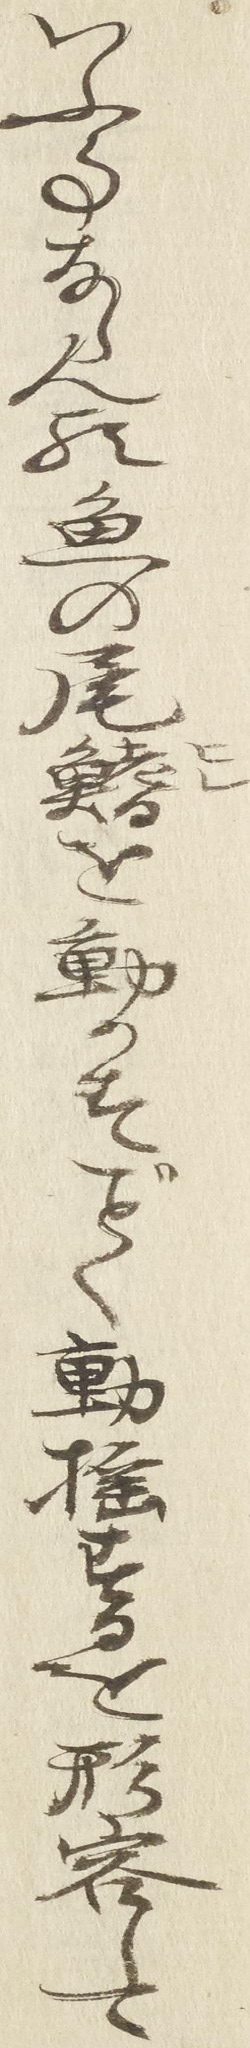いふ事ならむ歟魚の尾鰭を動かすごとく動揺するを形容して
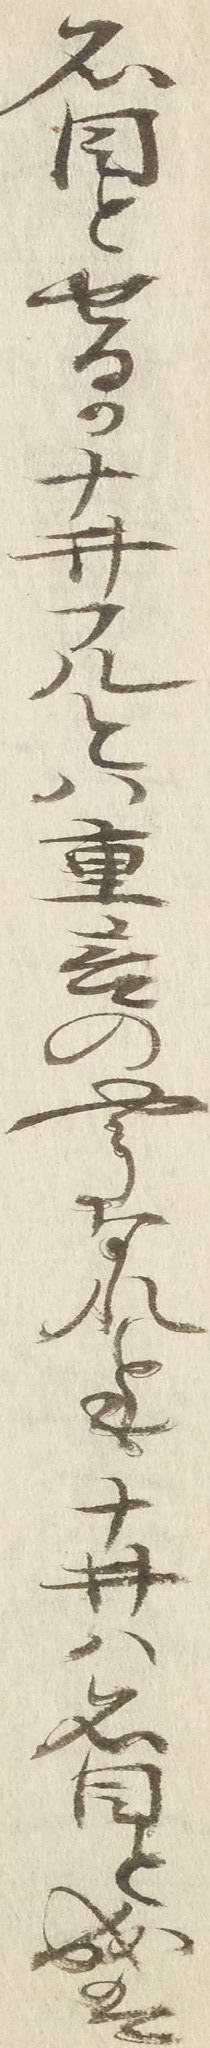名目とせるかな井ふるとは重言のやうなれどもな井は名目と成は
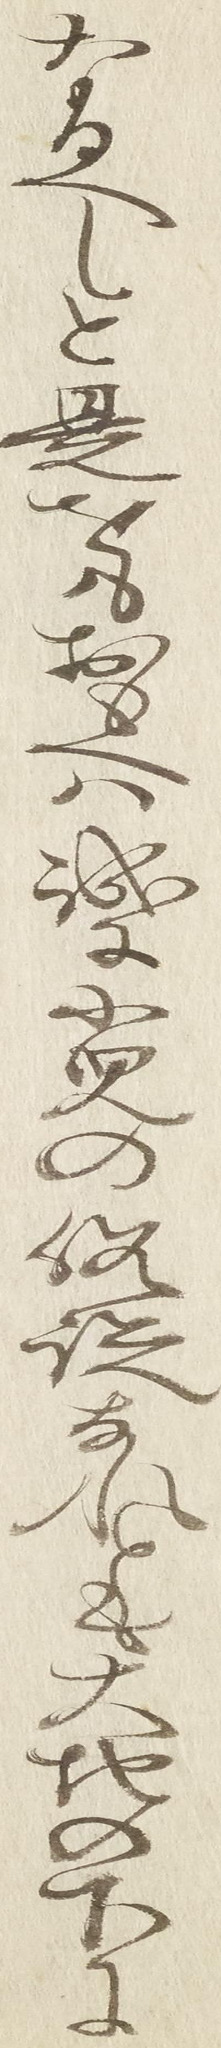なるべしと是をもおもへは誠に小児の俗説なれとも大地の下に
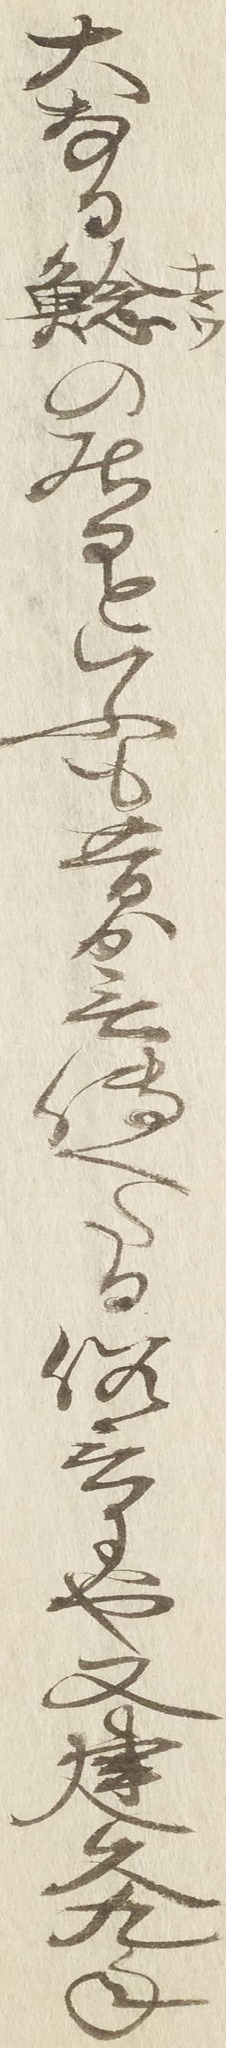大なる鯰の居るといふも昔ゟ言伝へたる俗言にや又建久九年
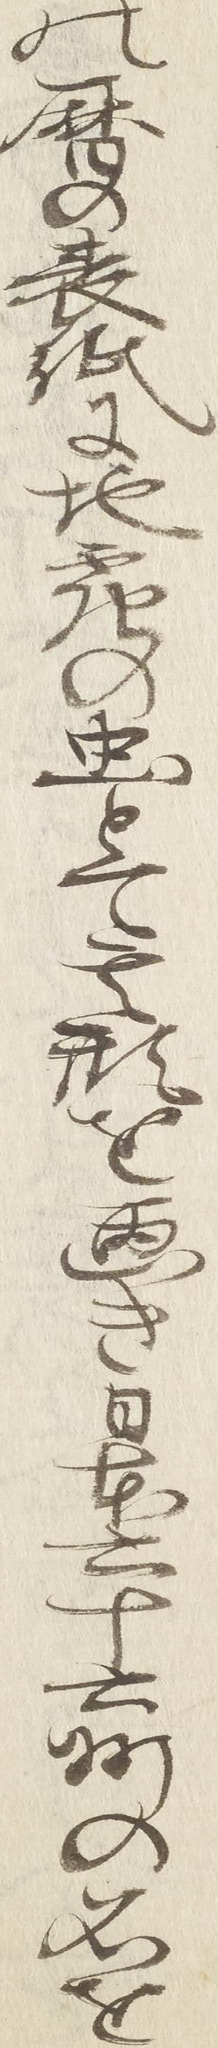の暦の表紙に地震の虫とて其形を画き日本六十六州の名を
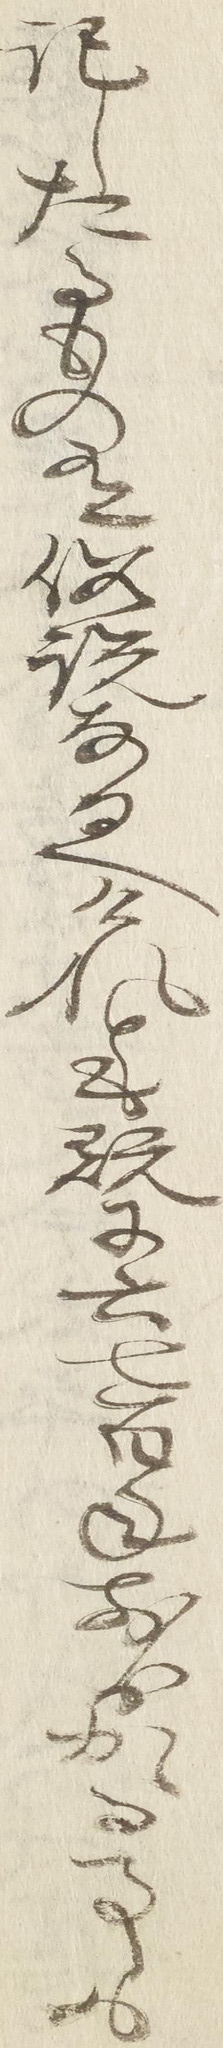記したるもの有俗説なるべけれとも既に六七百年前ゟかゝる事も
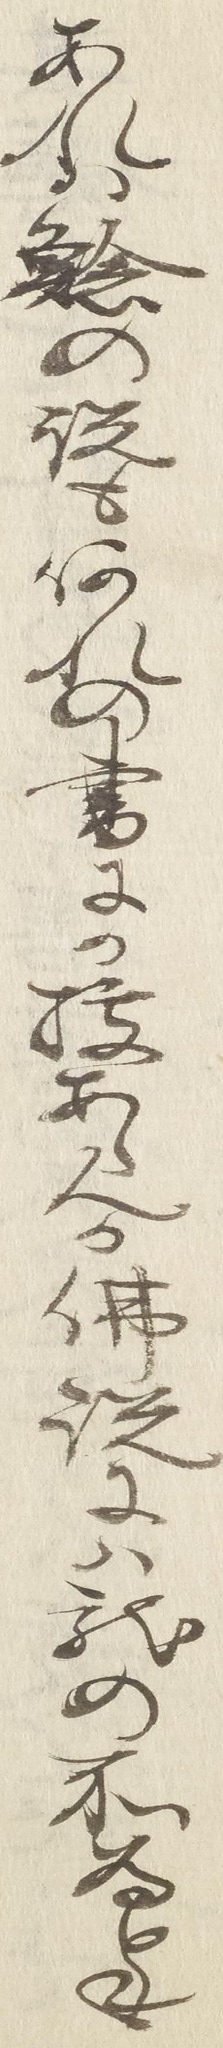の説も何れの書にか拠あらんか仏説には龍の所為とも
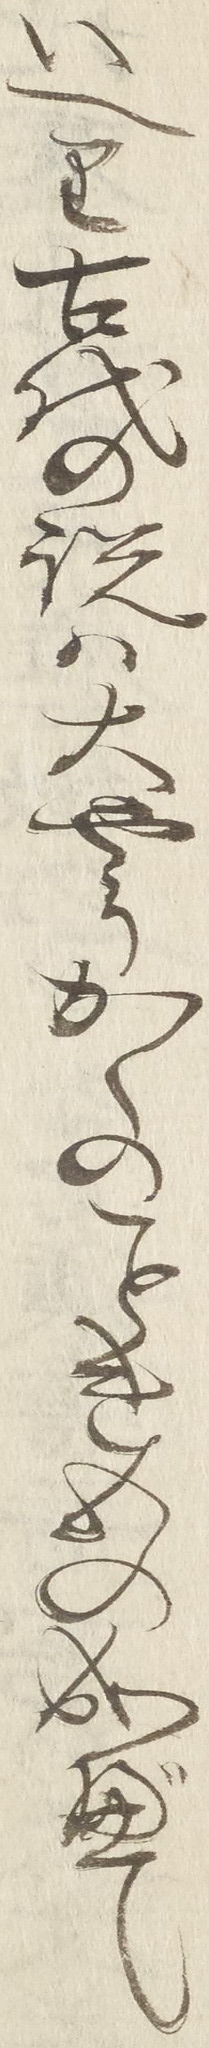いへり古代の説は大やうかくのごときもの成べし
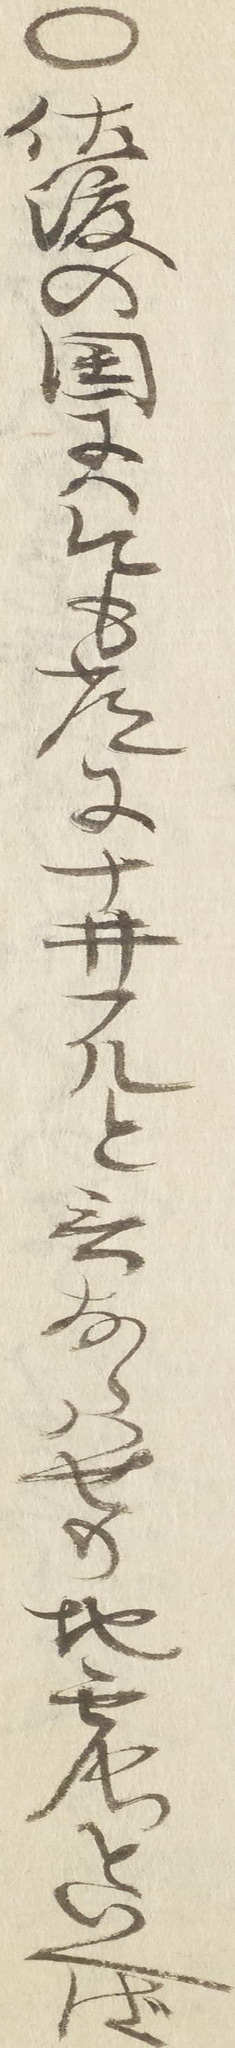○佐渡の国には今も常にな井ふると言ならはせり地震といへば
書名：地震記　下
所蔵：東京大学地震研究所図書室 Earthquake Research Institute Library, The University of Tokyo, JAPAN
